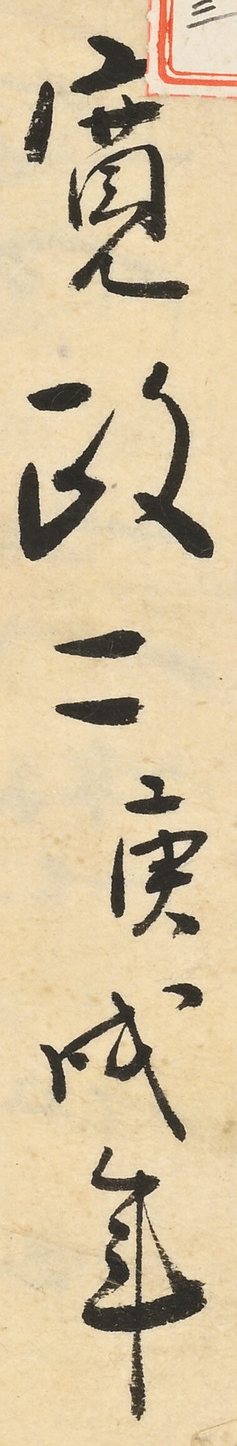寛政二庚戌年
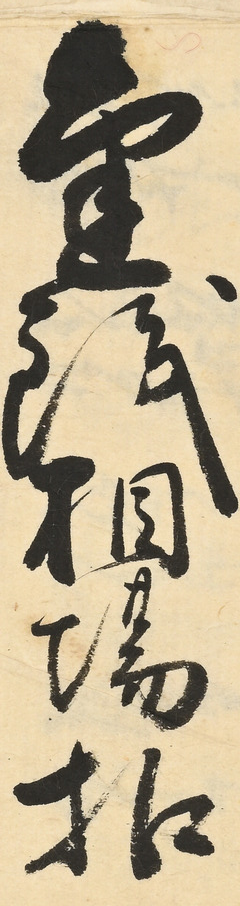金銭相場控

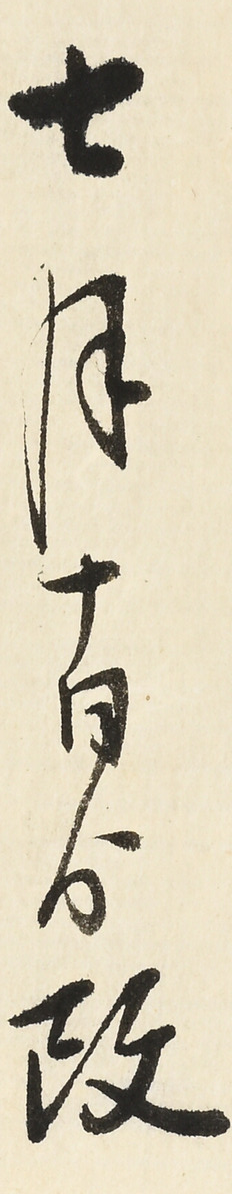七月十日ゟ改
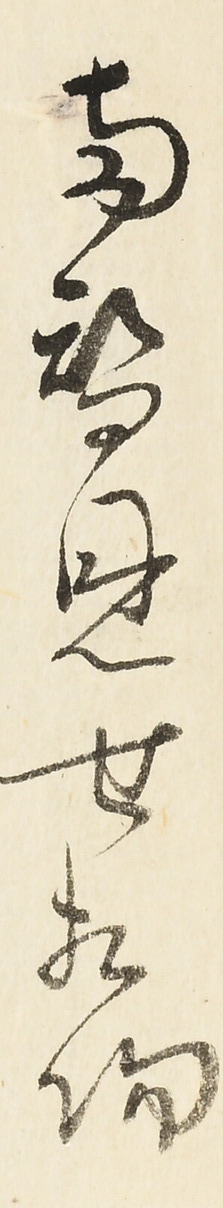両替見世相場
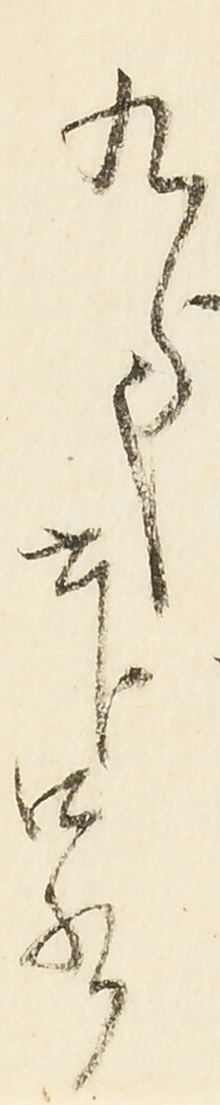九匁六分四厘
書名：金銭相場扣
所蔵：伊那市立高遠町図書館・合同会社AMANE
